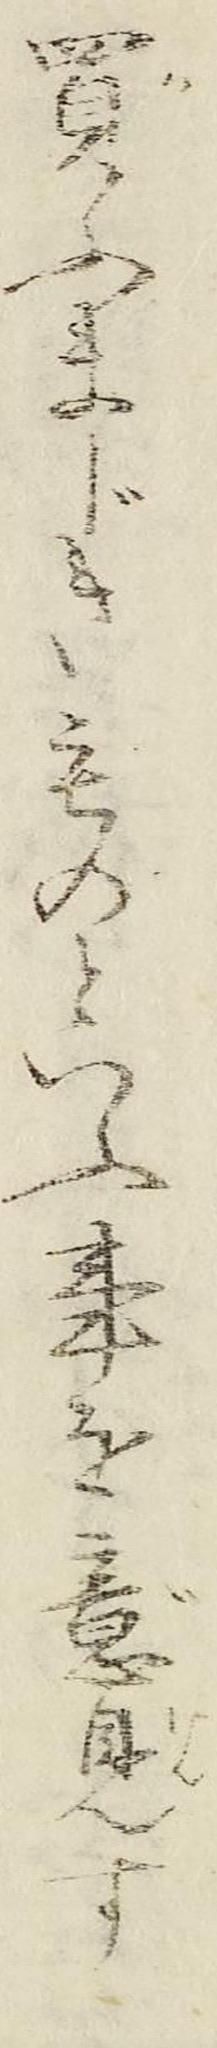買ふまじきものといふ事を意見す
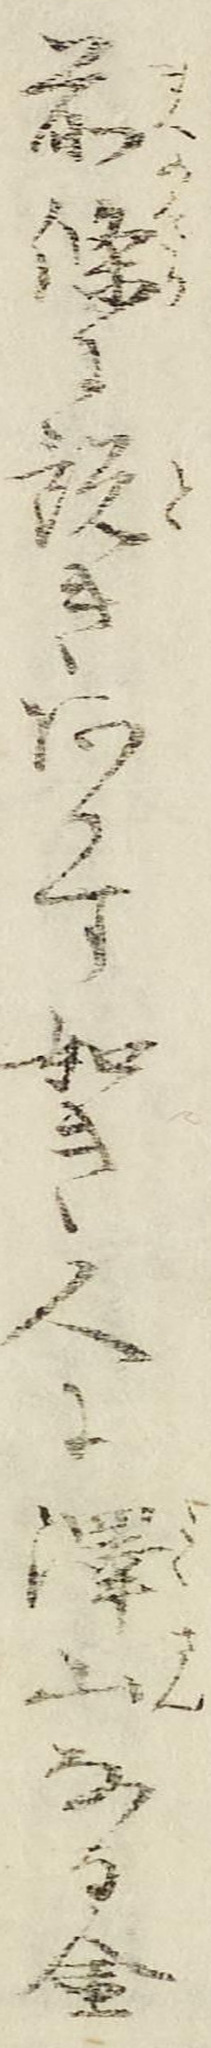前条に説きあかす如き人に沢山なる金
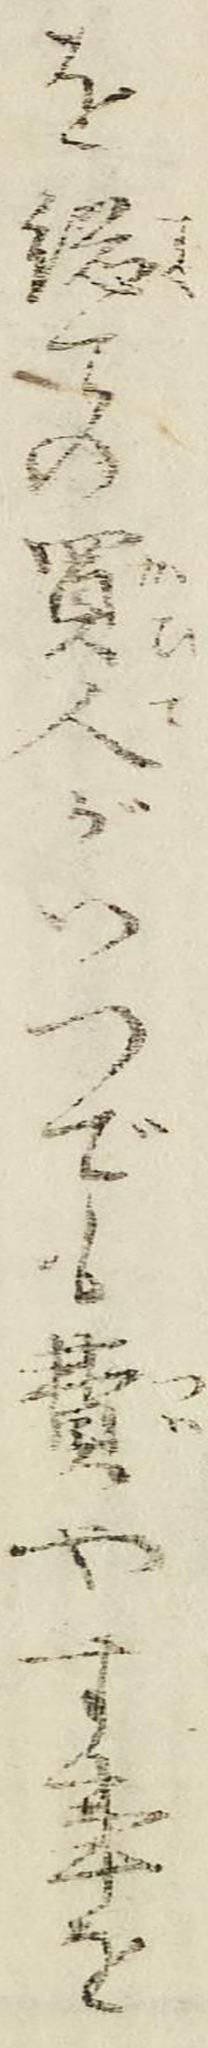を総ての買手がいつでも費やす事を
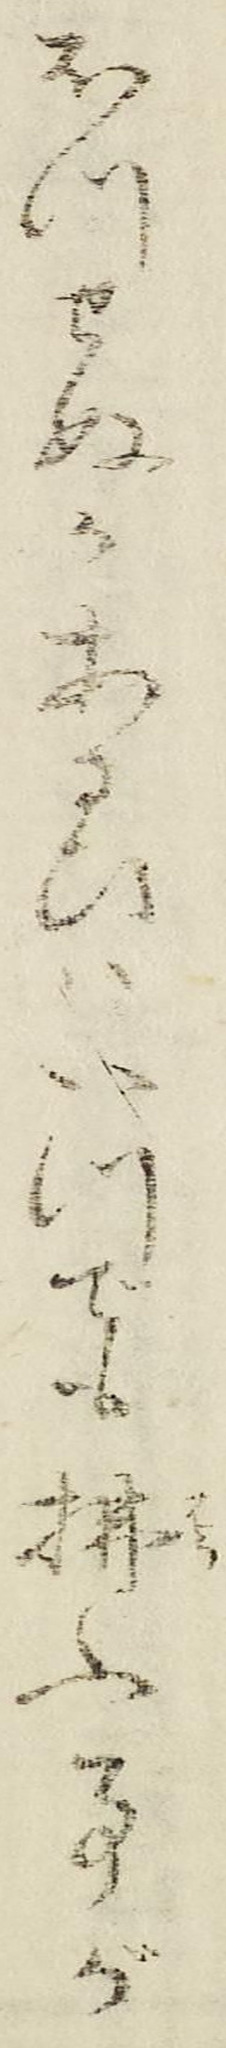ほつせぬかあるひはいつでも払ふ事が
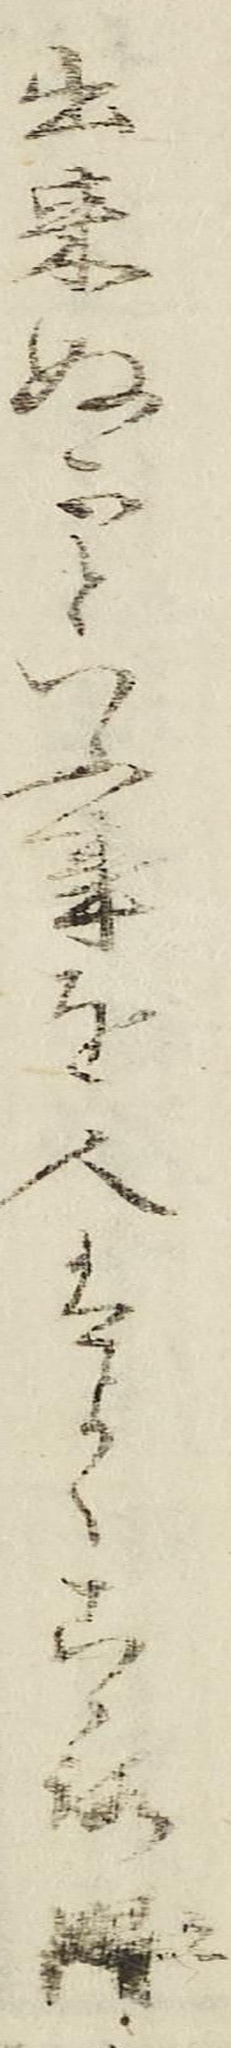出来ぬかといふ事を人はよくこゝろ得
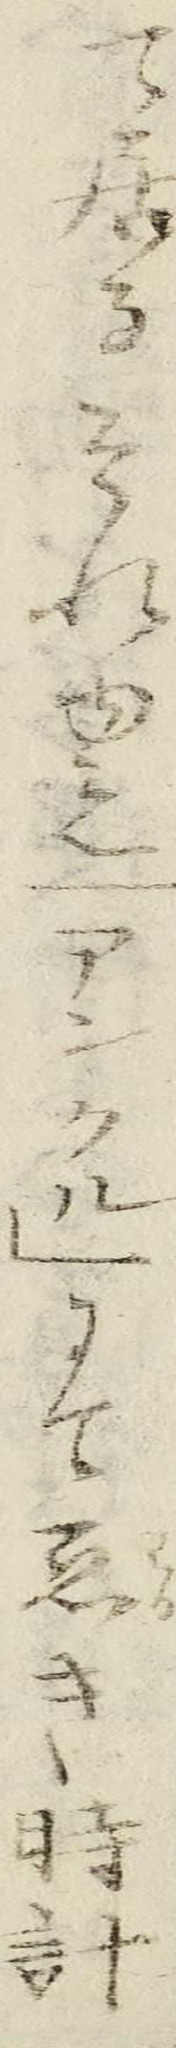て居るそれゆえ「アンクル」にて悪き時計
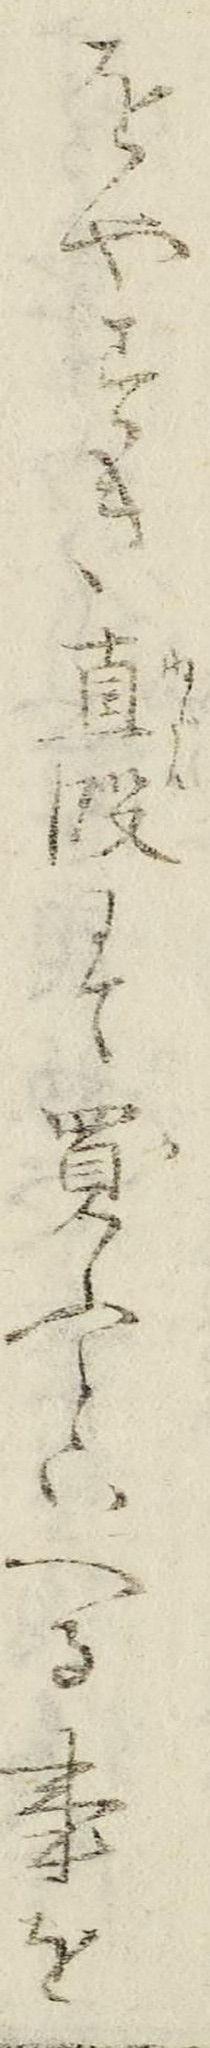をやすき直段にて買ふといへる事を
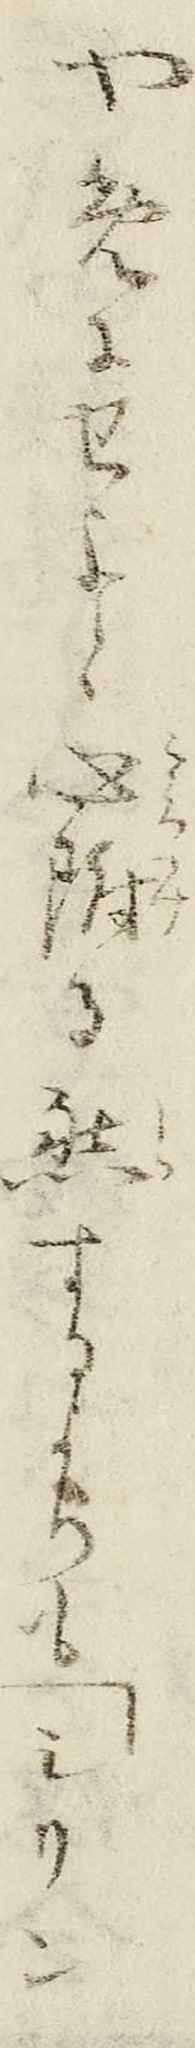やめにせよと心附る然するよりも「シリン
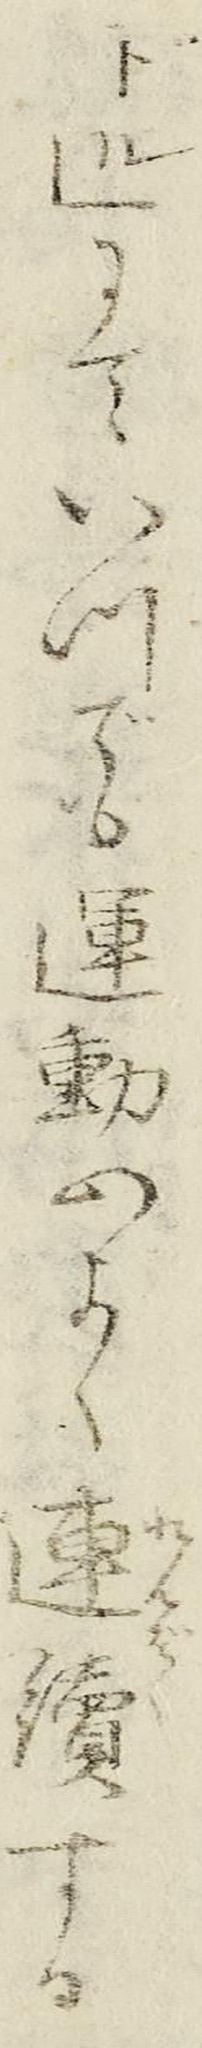ドル」にていつでも運動のよく連続する
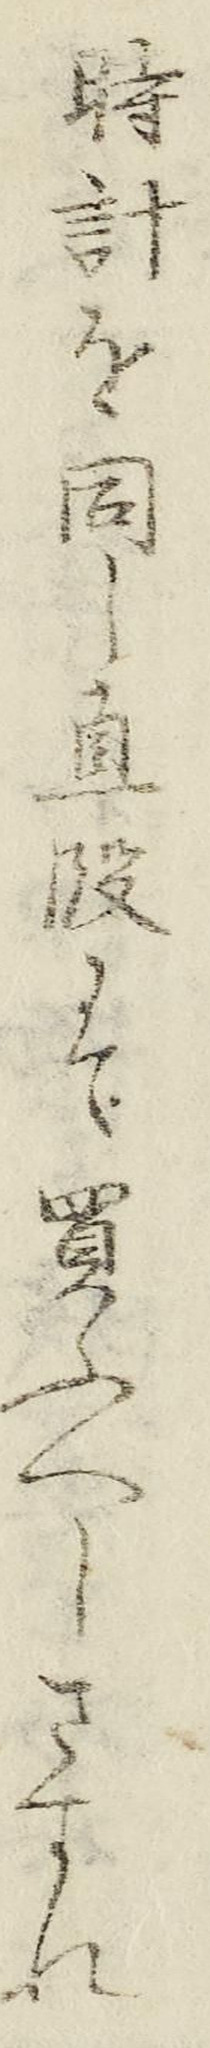時計を同し直段にて買ふへしさすれ
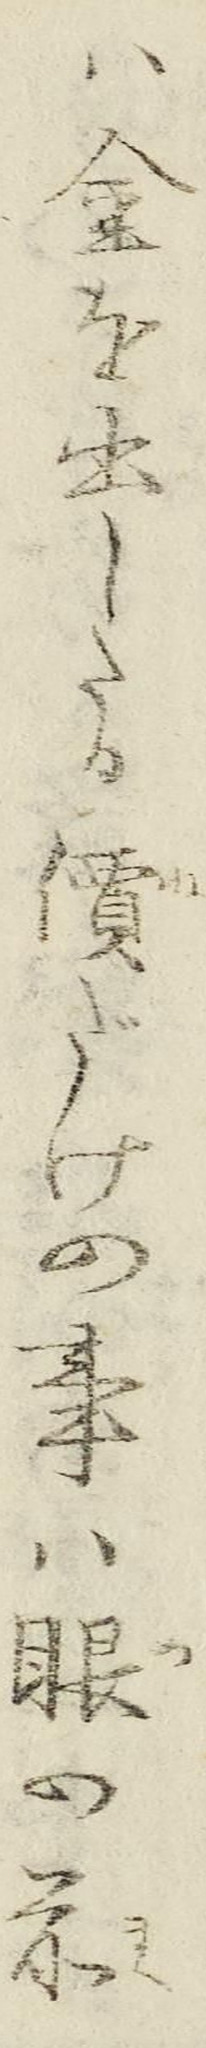は金を出したる価だけの事は眼の前
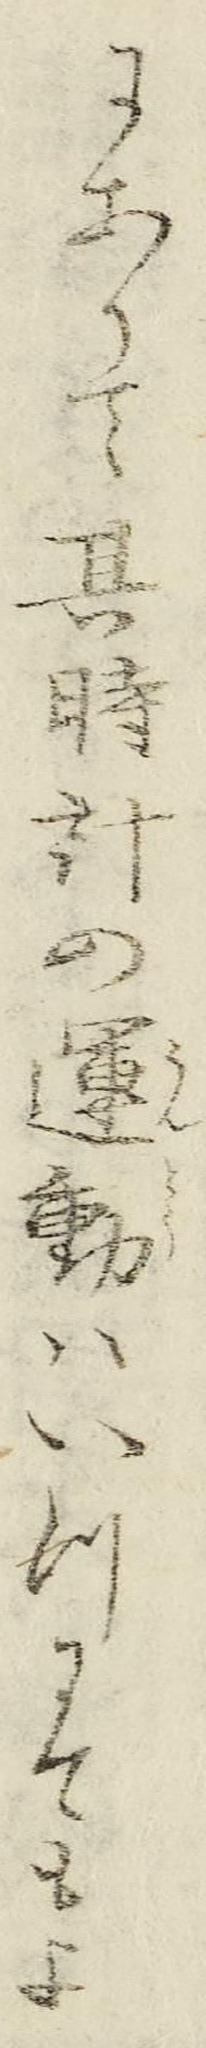にありて其時計の運動はいつにてもよ
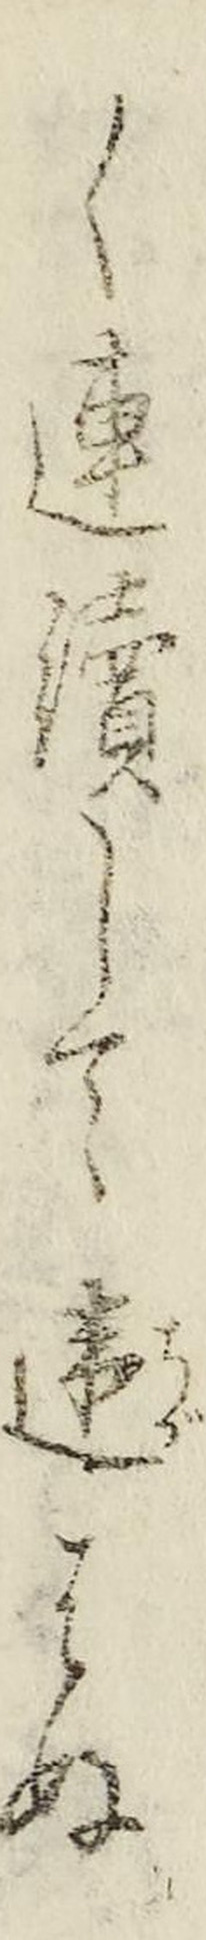く連続して違はぬ
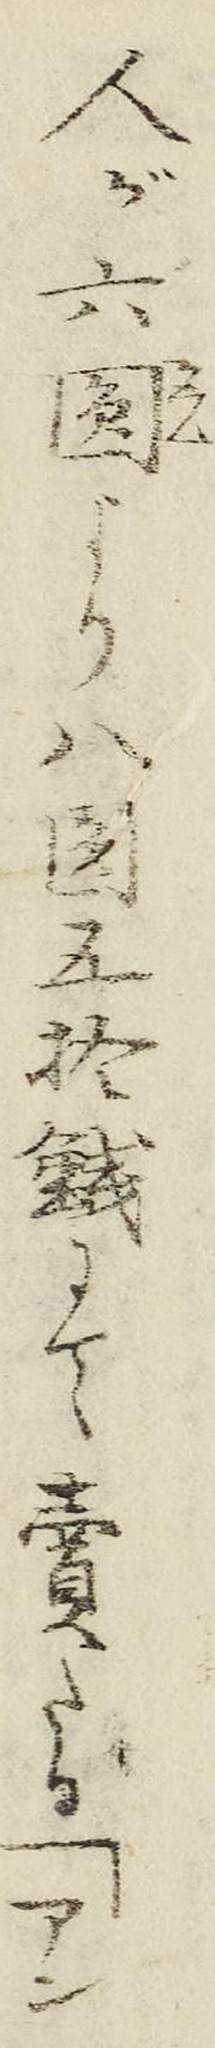人が六円より八円五拾銭にて売たる「アン
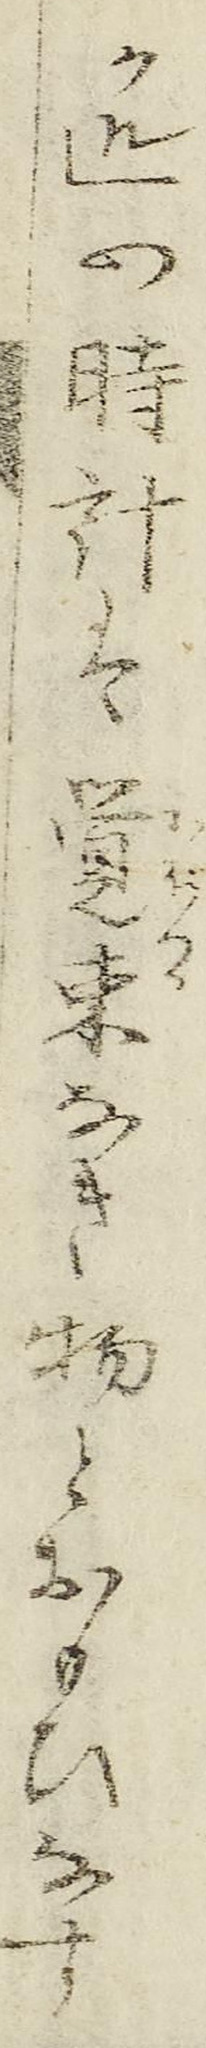クル」の時計は覚束なき物とおもひなす

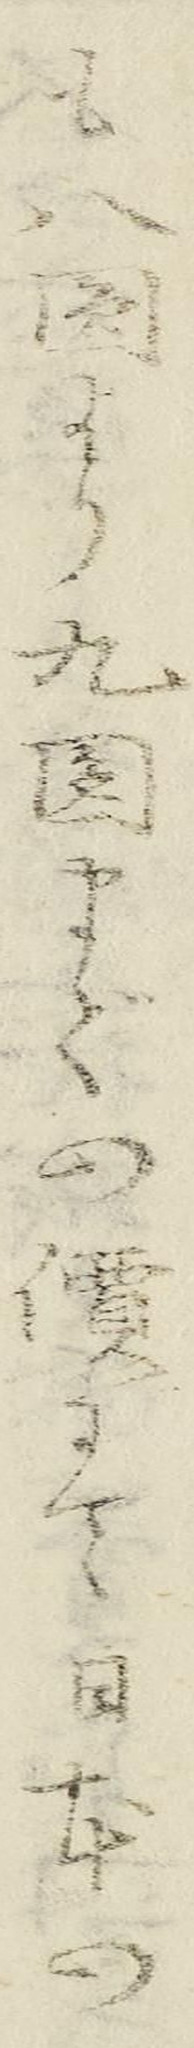も八円より九円までの価にて日本の
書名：[時計に関する冊子]
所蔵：東京大学地震研究所図書室 Earthquake Research Institute Library, The University of Tokyo, JAPAN
